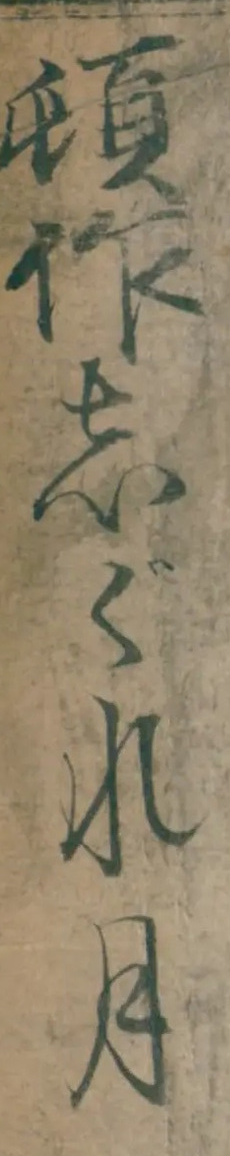頓作しぐれ月全

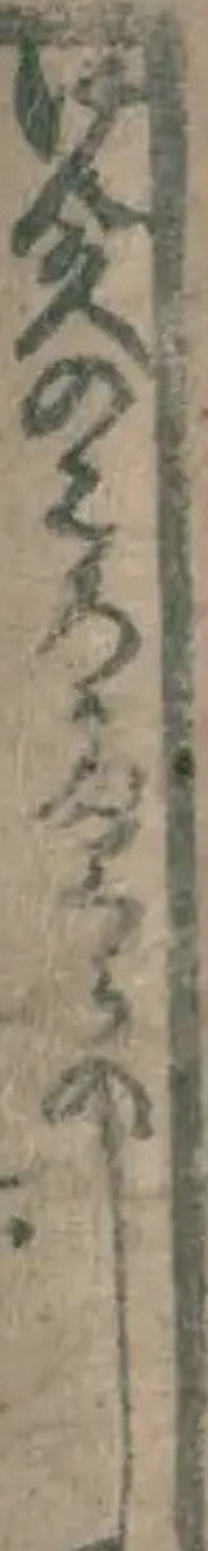けん久のころかまくらの
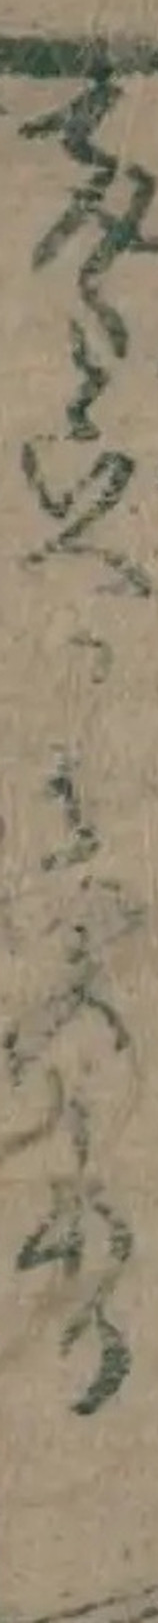てん〳〵といへけるかのしあり
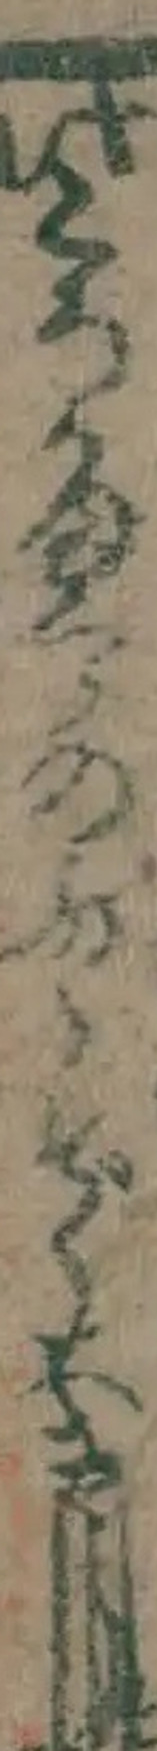此ころかまくらのふうぞく大き
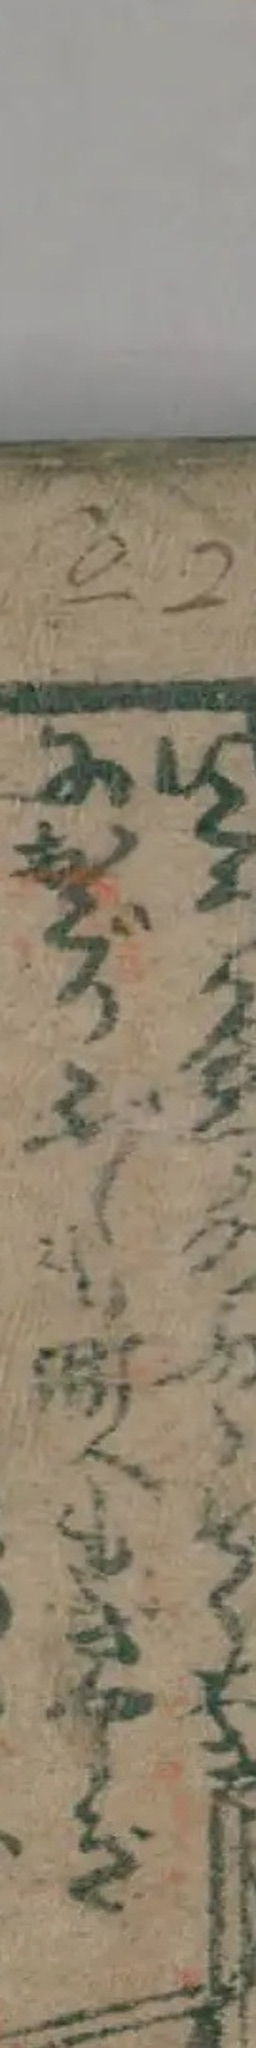におごりぶしも町人もぎやうぎ
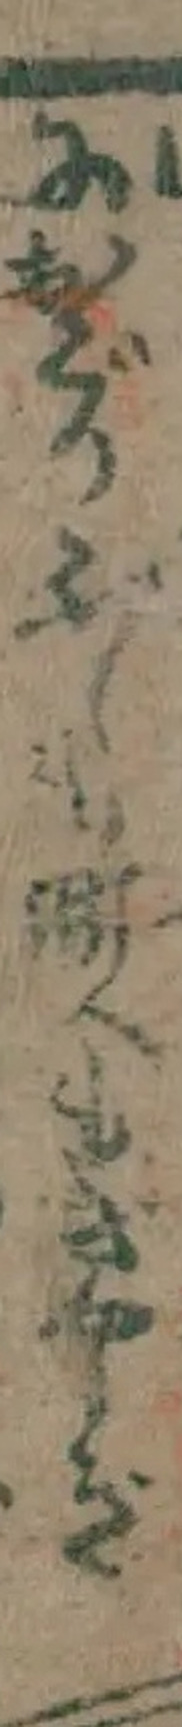におごりぶしも町人もぎやうぎ
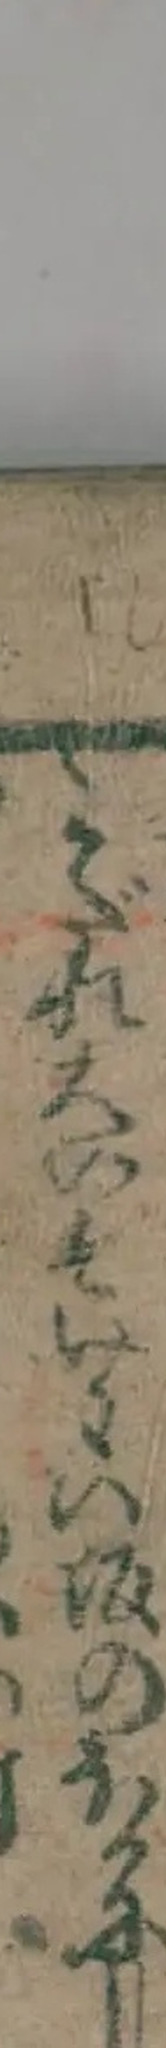みだれ大いそけわい坂のほかに
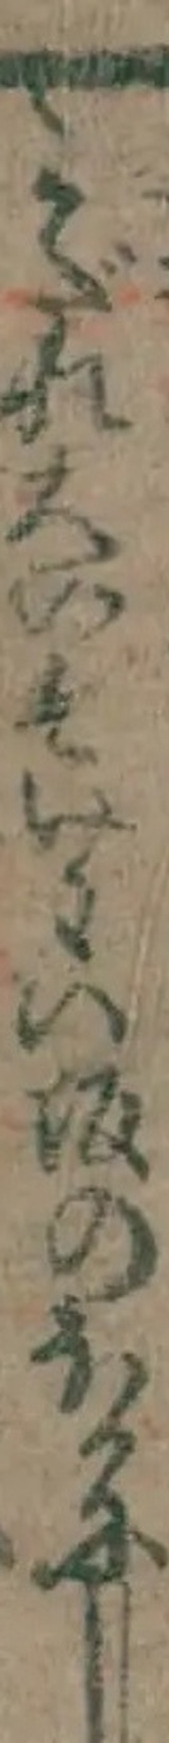みだれ大いそけわい坂のほかに
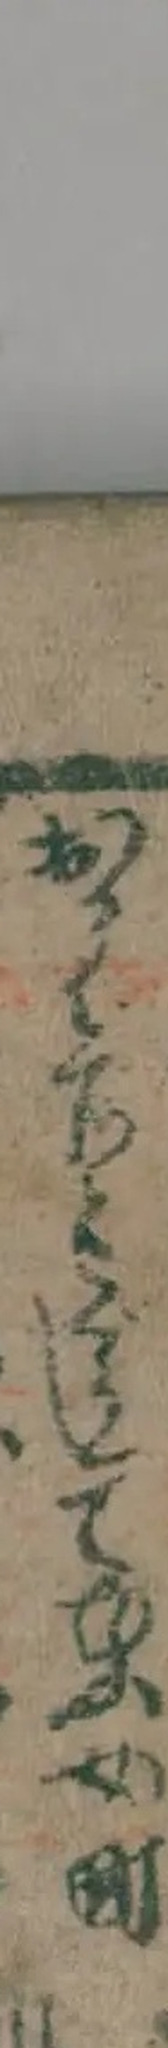おかば所とごうしてゆふ女町
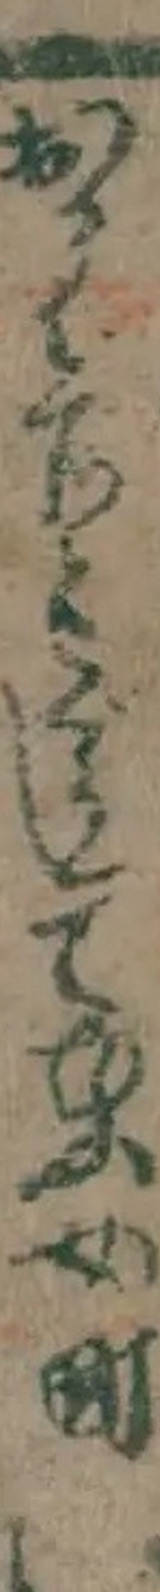おかば所とごうしてゆふ女町
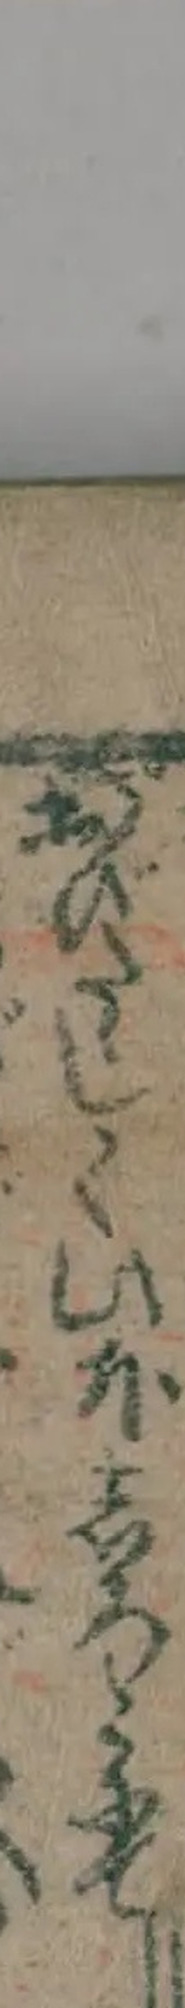おびたゝしく此外しろとにて
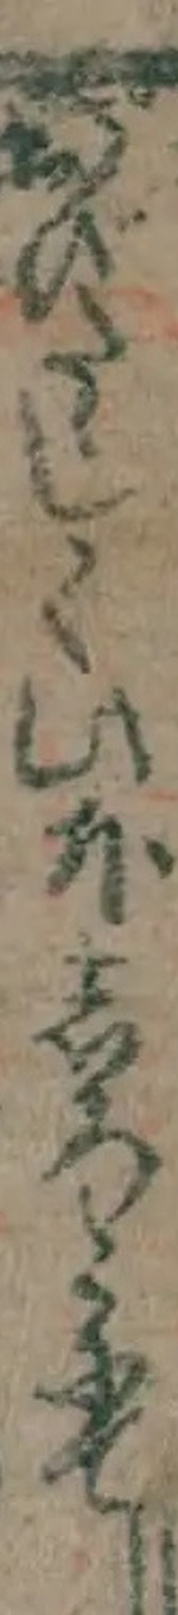おびたゝしく此外しろとにて
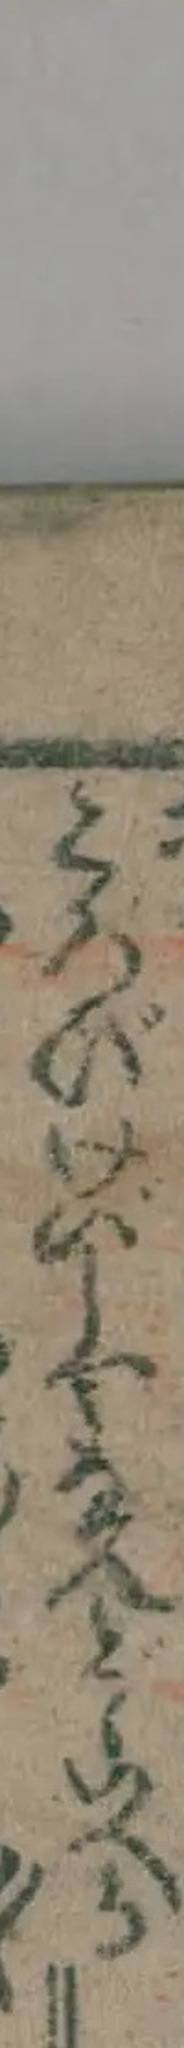ころびげいしやなんどともいへる
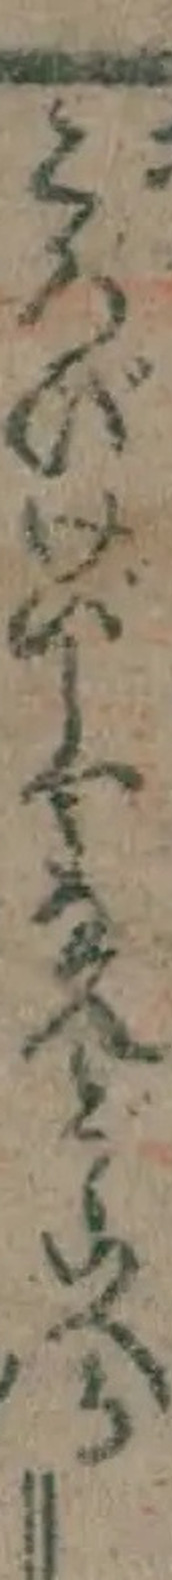ころびげいしやなんどともいへる
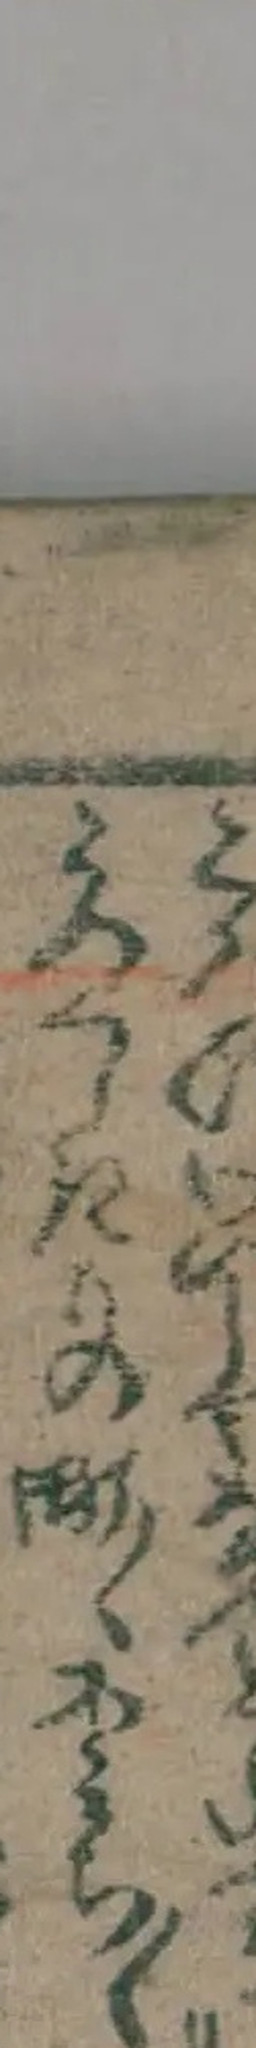うつくしきもの町〳〵にみち〳〵
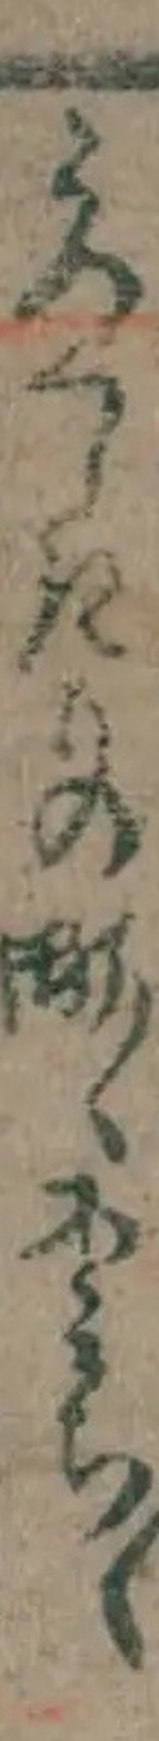うつくしきもの町〳〵にみち〳〵
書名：頓作時雨月 3巻
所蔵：国立国会図書館 National Diet Library, JAPAN
